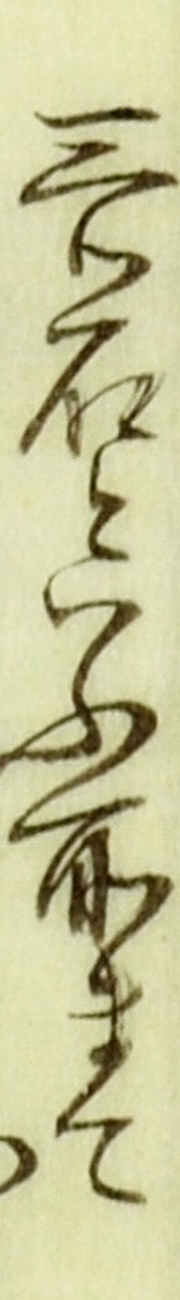三ツ石といふ所まで
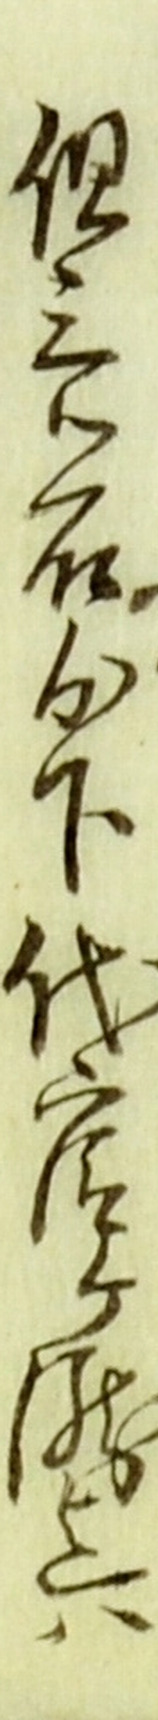但三ツ石ゟ下代官ヶ瀧迄ハ
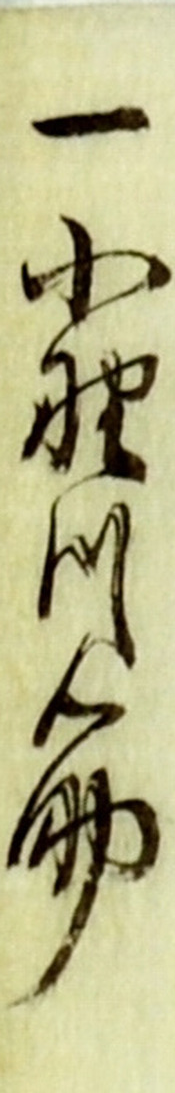一小野川筋
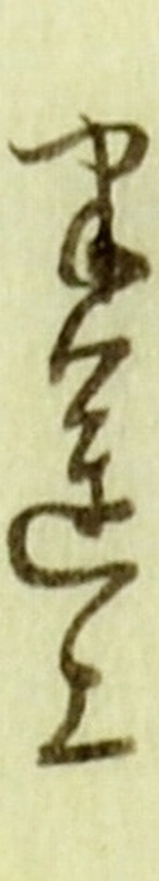半送上

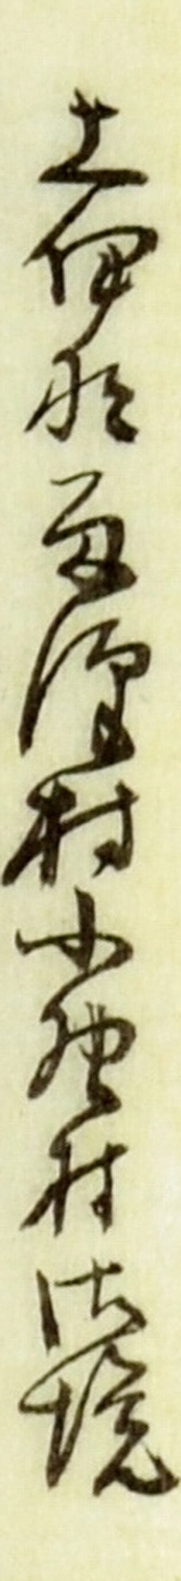上伊那雨沢村小野村御境
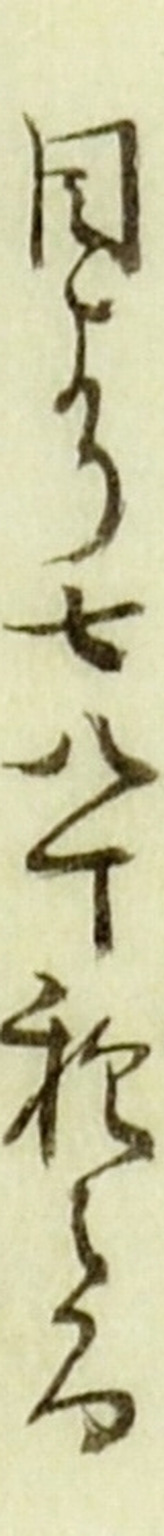目より七八丁程之而
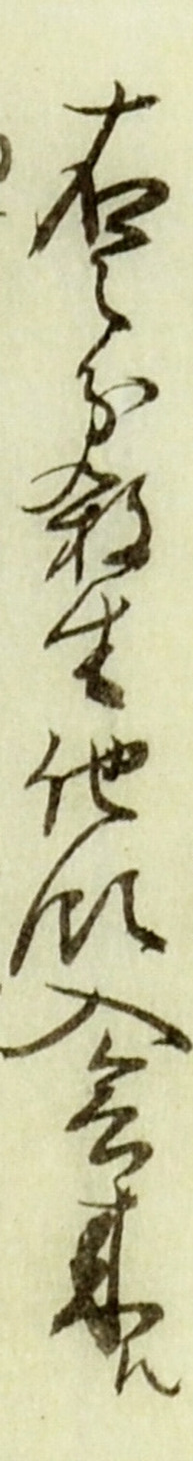右之分殺生他領入会来ル
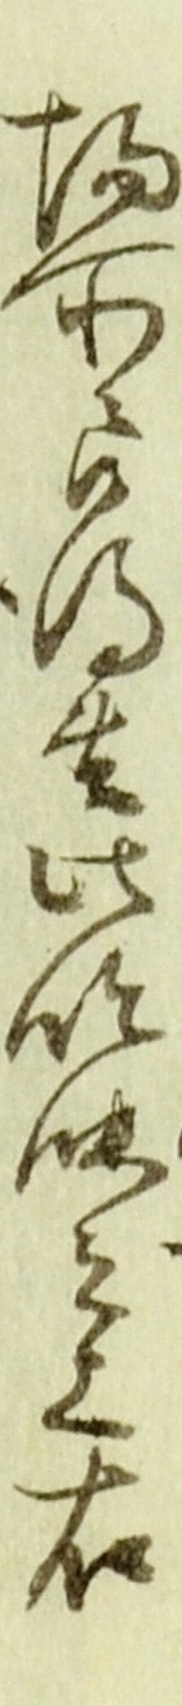場所に候得共此吟味之上右
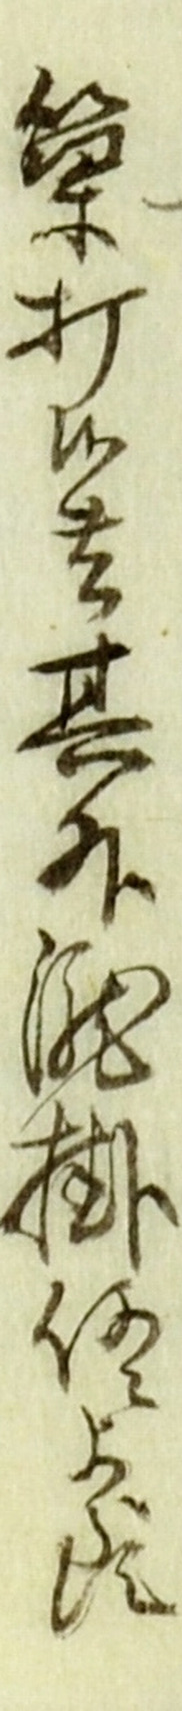簗打候共其外瀧掛何二よらす
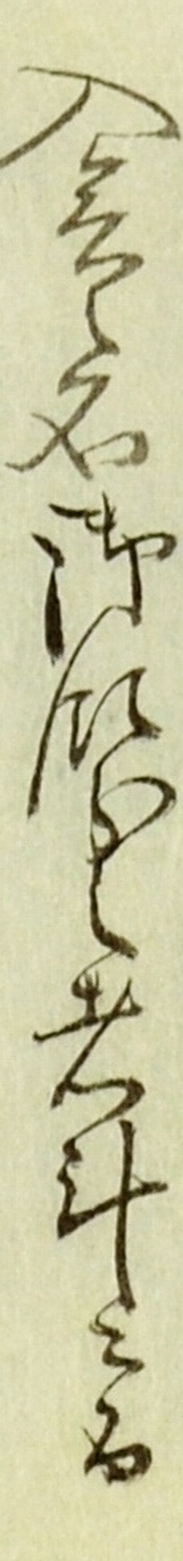入会之名御領分之者斗二而
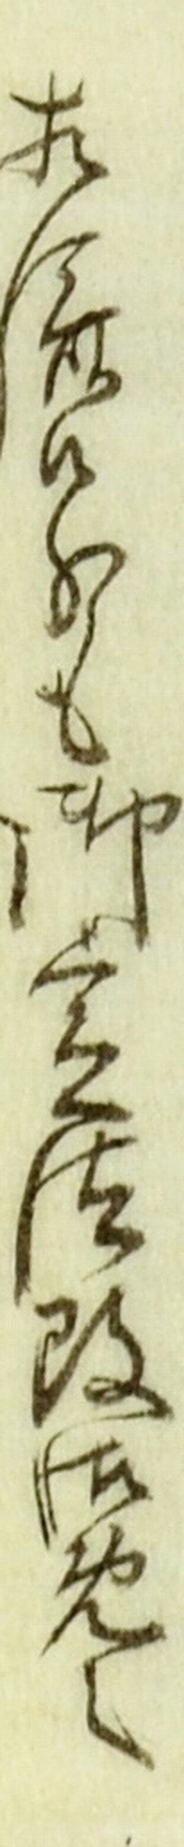相済候分も御定法改御免之
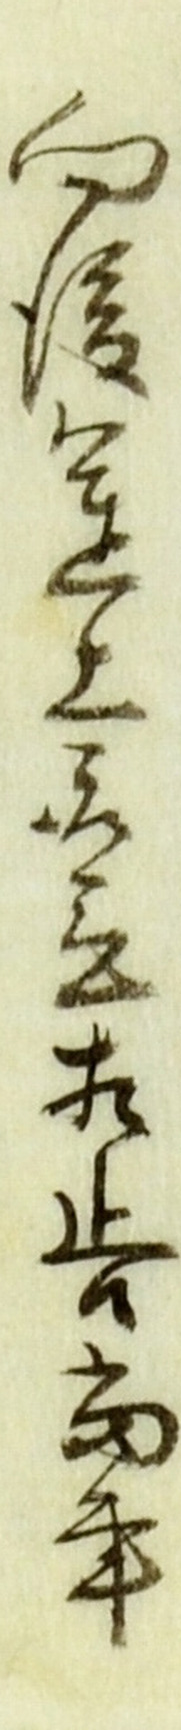向後運上取立相止候当年
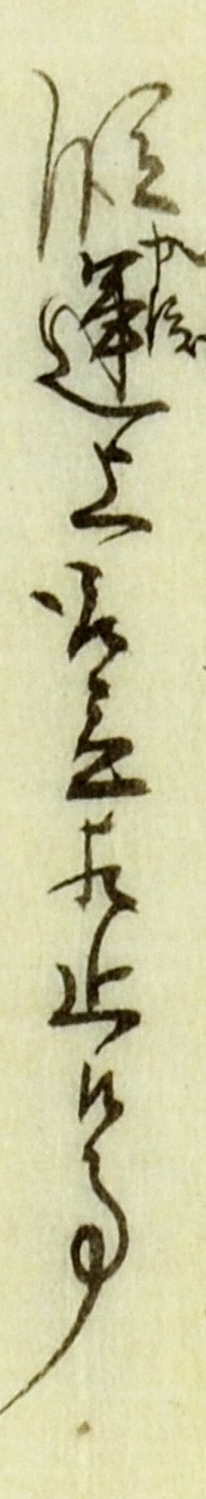段運上取立相止候事
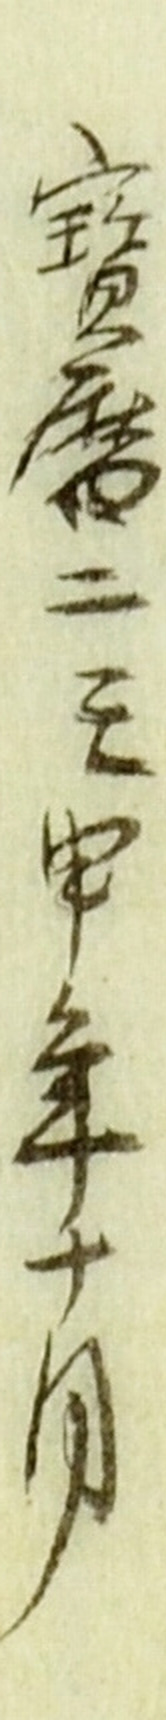宝暦二壬申年十月
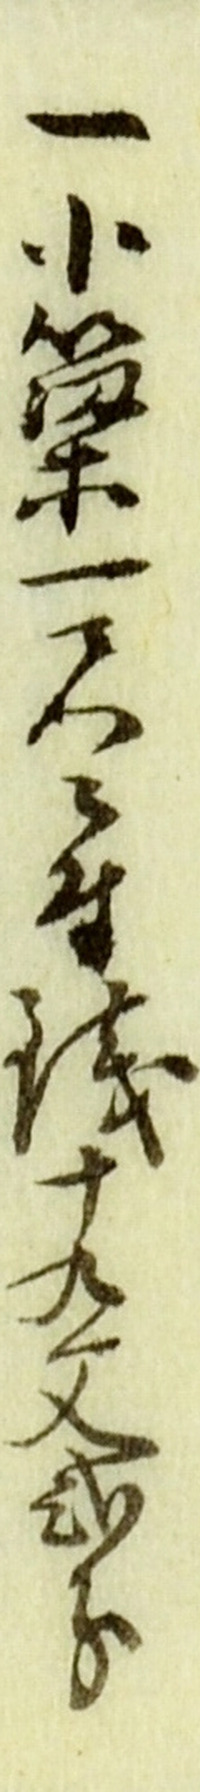一小簗一尺二付残十九文弐分
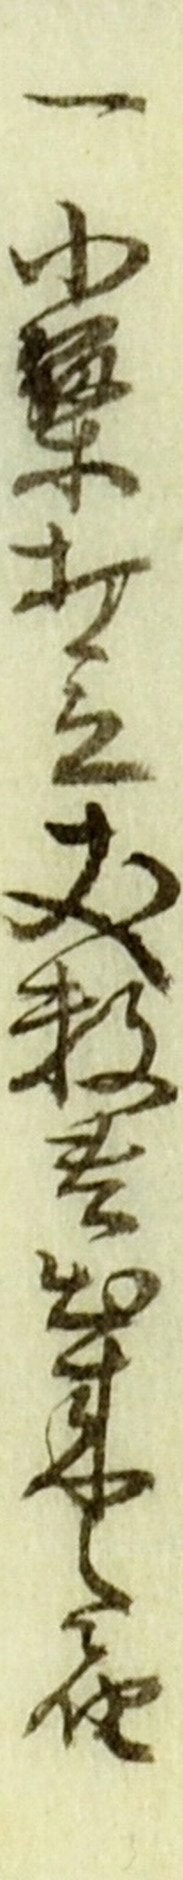一小簗打立丈数共出来之届
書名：分一御定法
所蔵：伊那市立高遠町図書館・合同会社AMANE
